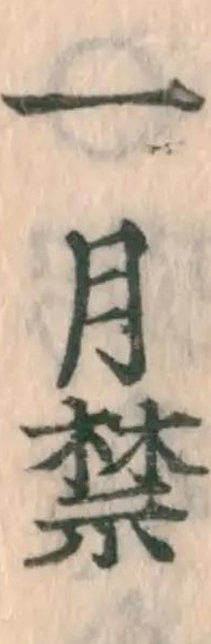一月禁
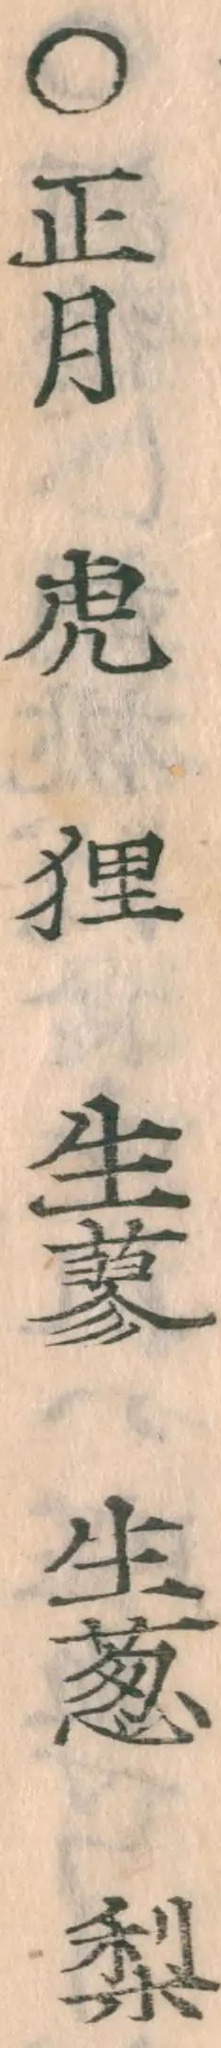〇正月虎狸生蓼生葱梨
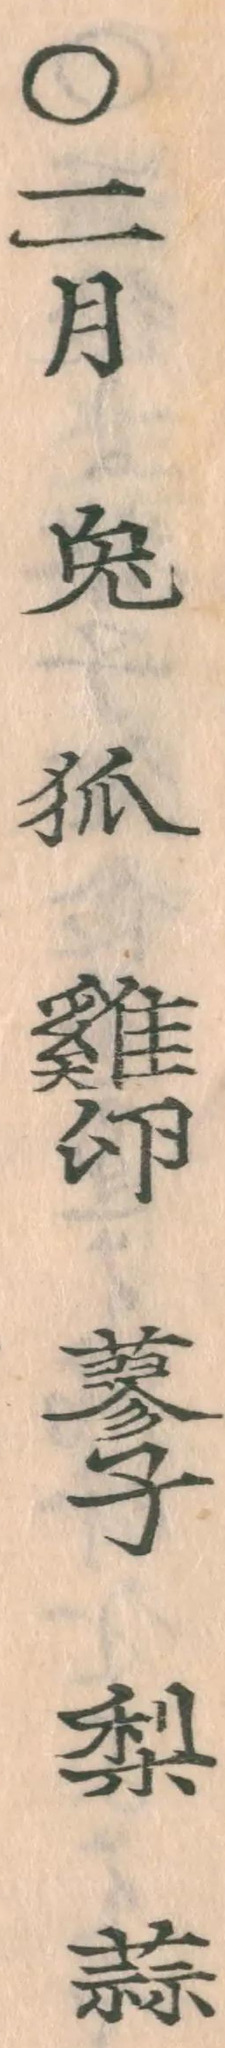〇二月兎狐鶏卵蓼子梨蒜
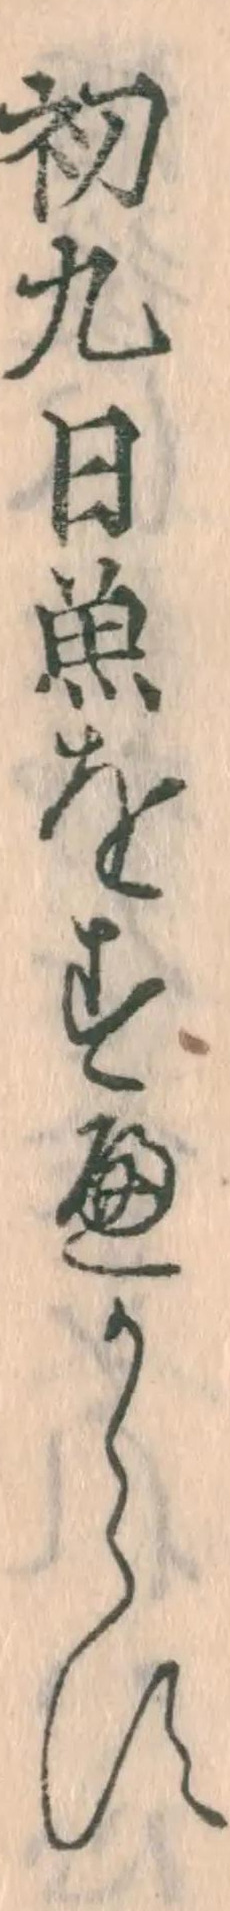初九日魚をすへからす
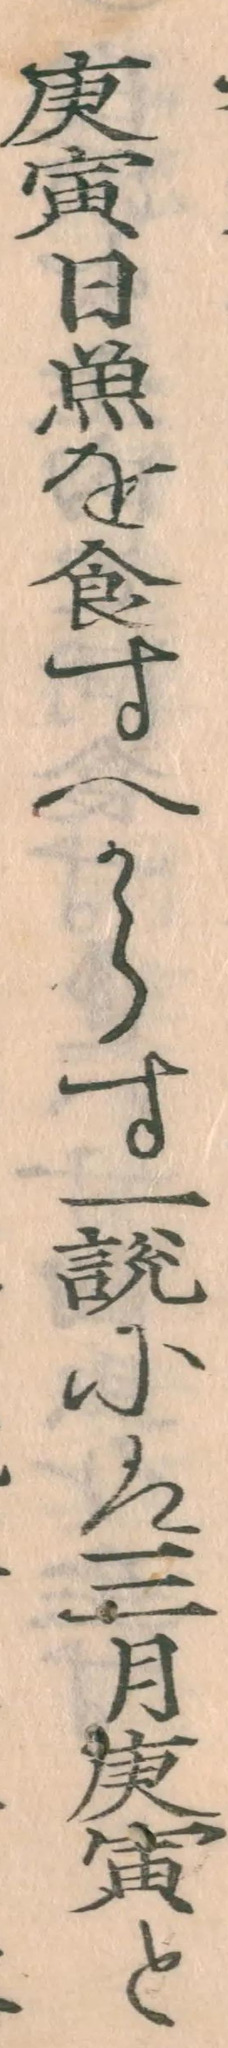庚寅日魚を食すへからす一説には三月庚寅と
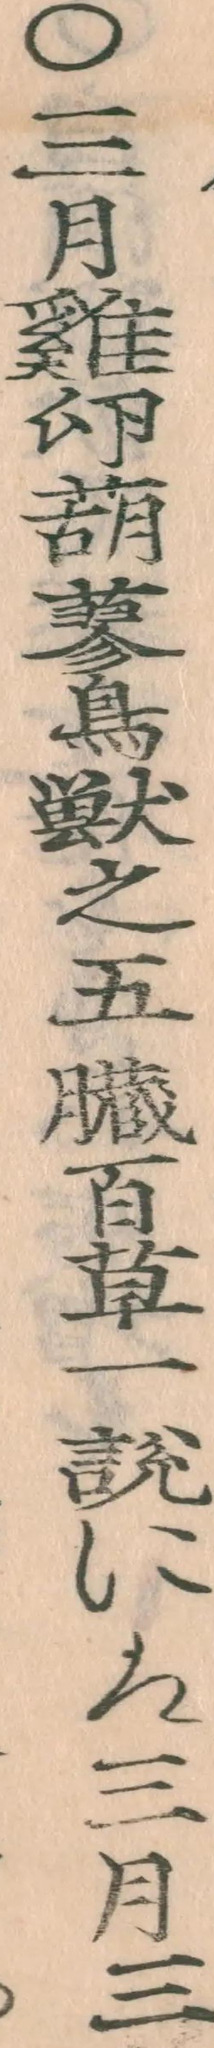〇三月鶏卵葫蓼鳥獣之五臓百草一説には三月三
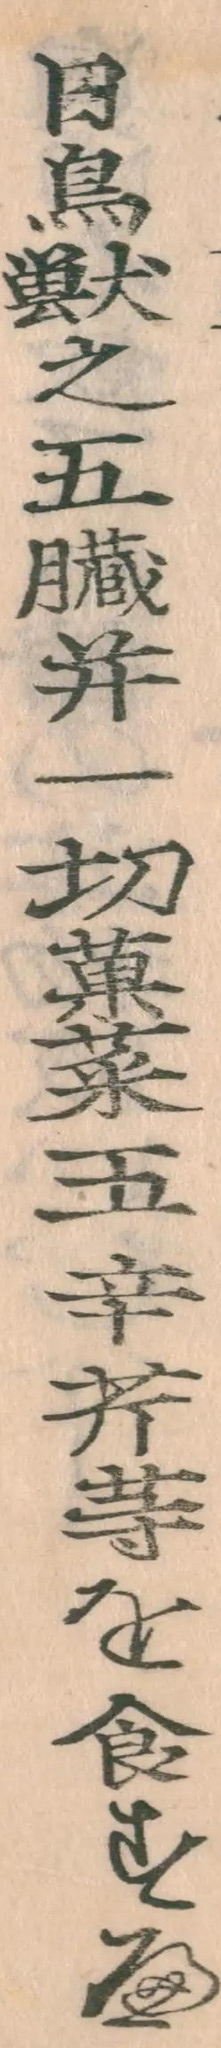日鳥獣之五臓并一切菓菜五辛芹等を食すへ
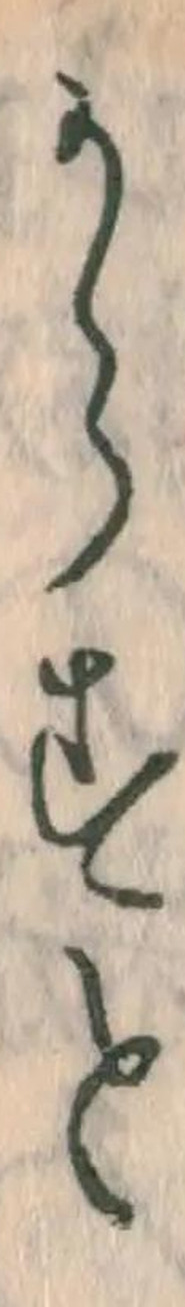からすと
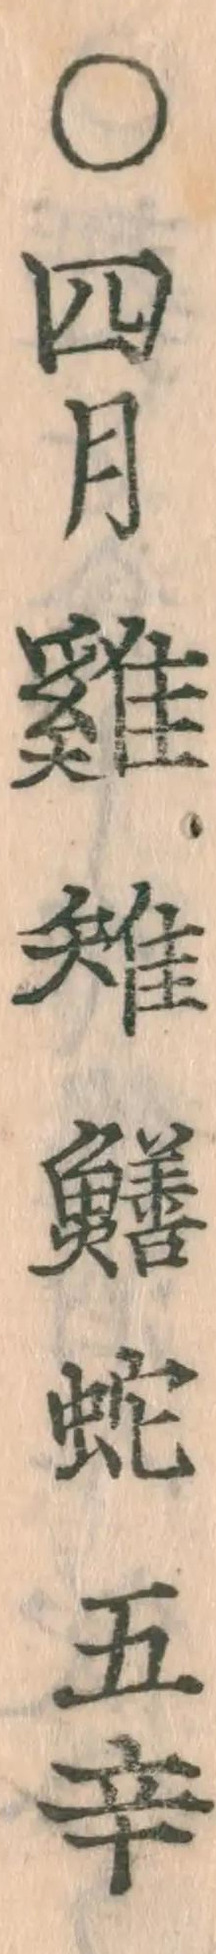〇四月鷄雉鱔蛇五辛
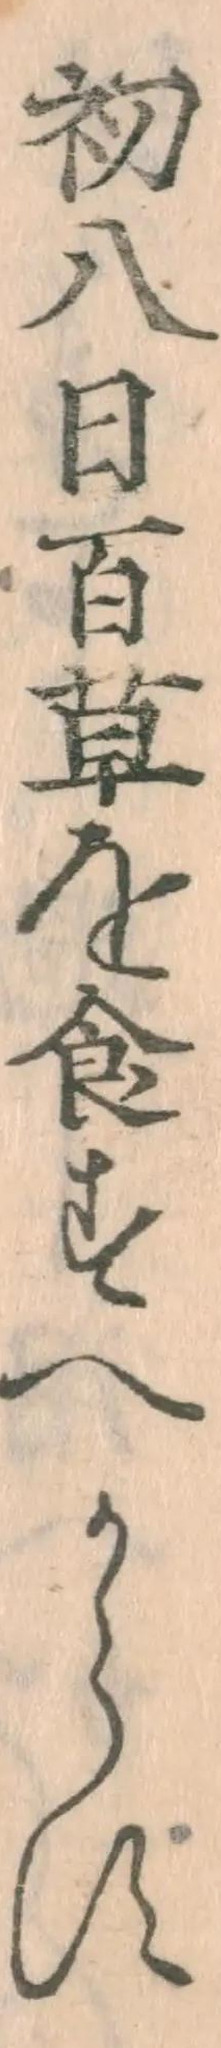初八日百草を食すへからす
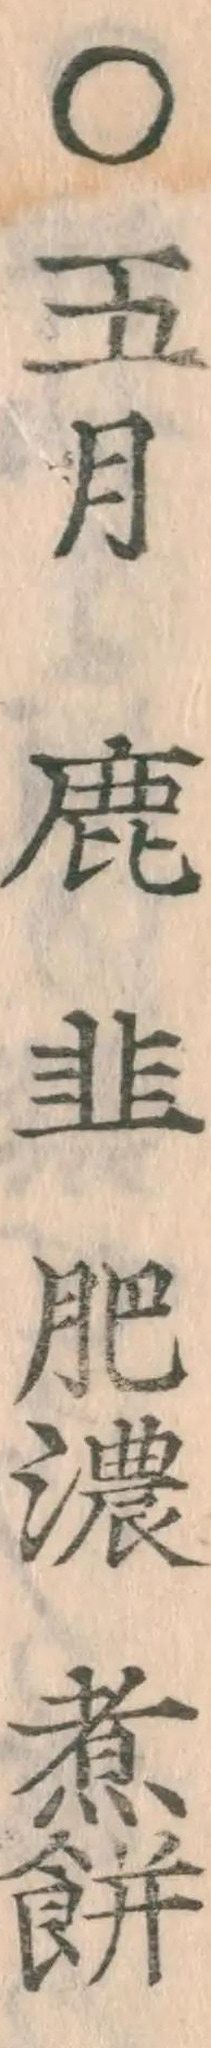〇五月鹿韮肥濃煮餅
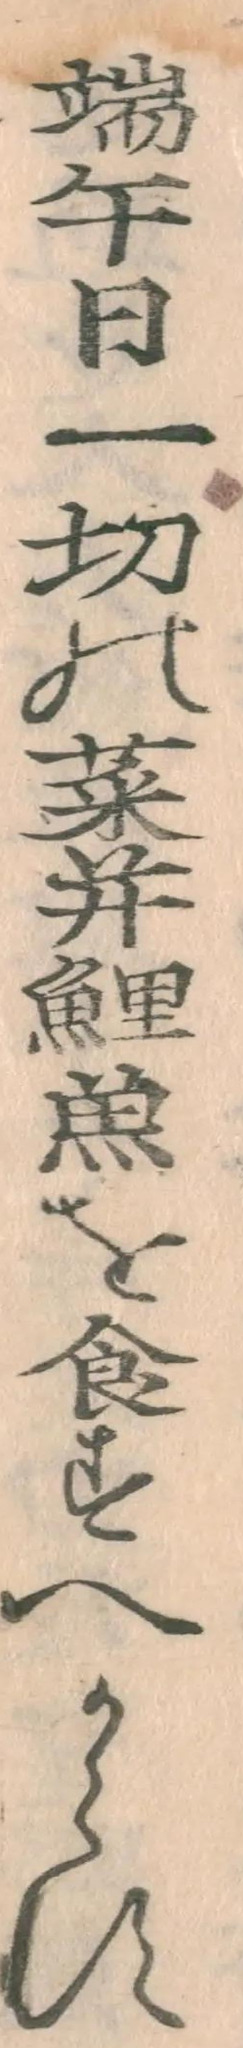端午日一切の菜并鯉魚を食すへからす
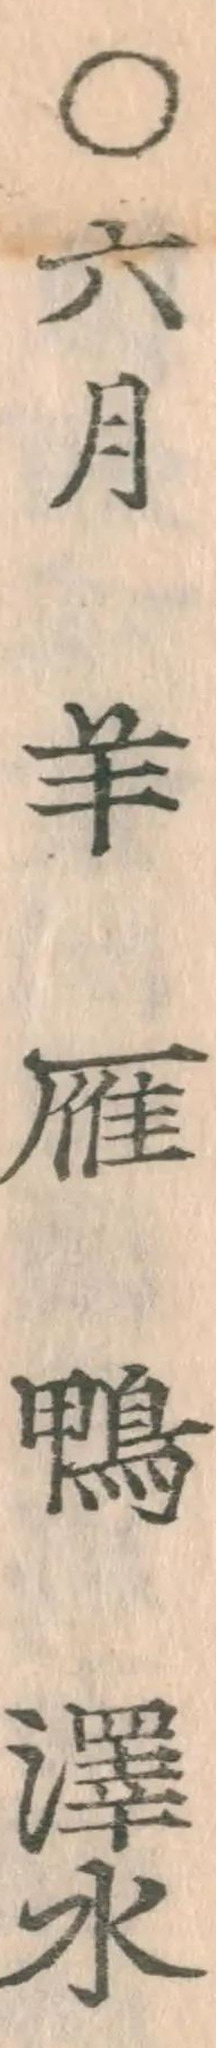〇六月羊雁鴨沢水
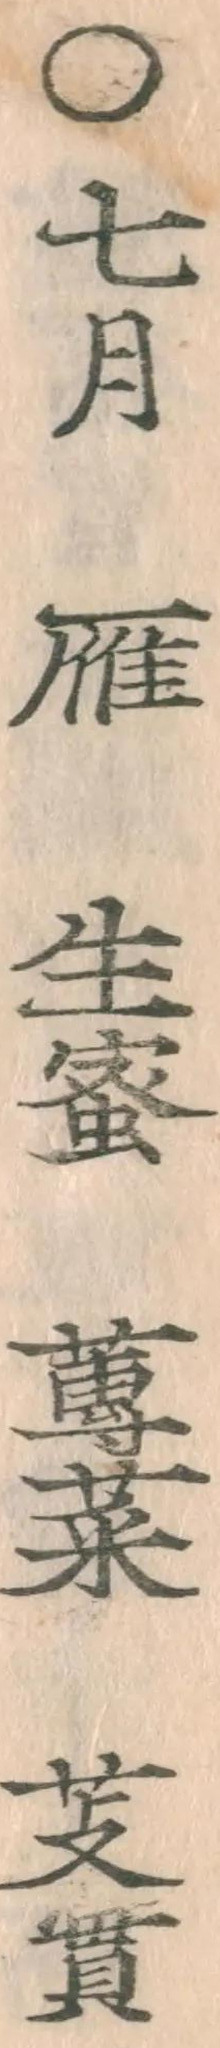〇七月雁生蜜蒪菜実
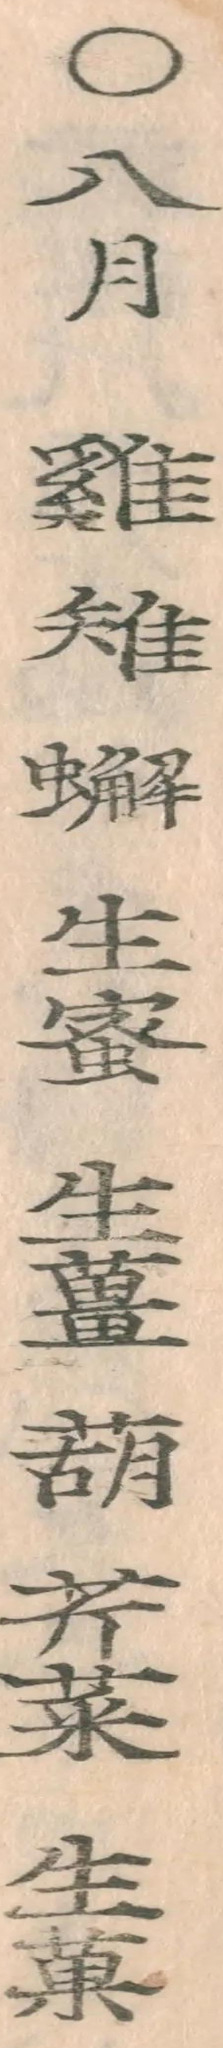〇八月鷄雉蟹生蜜生薑葫芹菜生菓
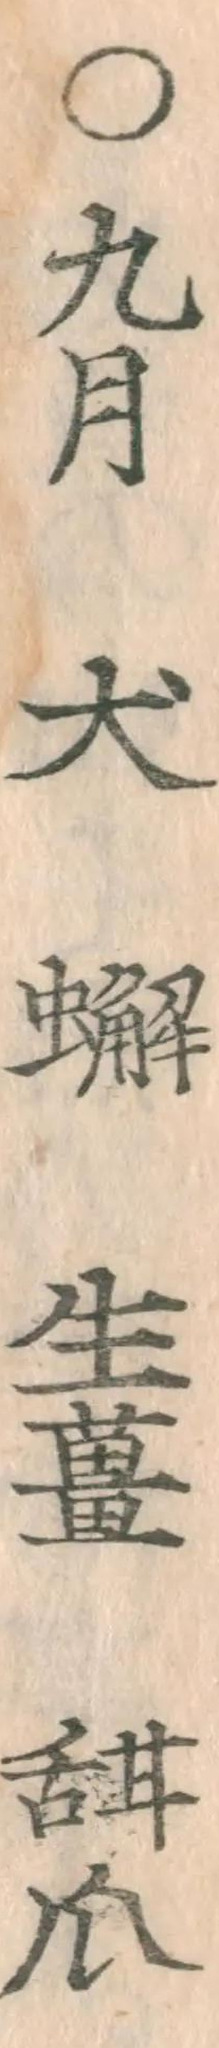〇九月犬蟹生薑甜瓜
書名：延壽撮要
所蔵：国立国会図書館 National Diet Library, JAPAN
